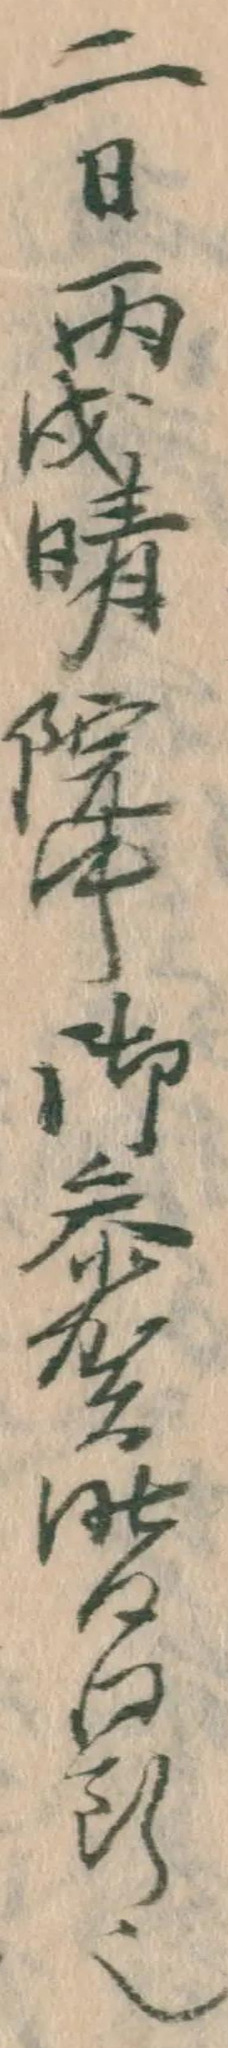二日丙戌晴院中御参賀昨日同断也
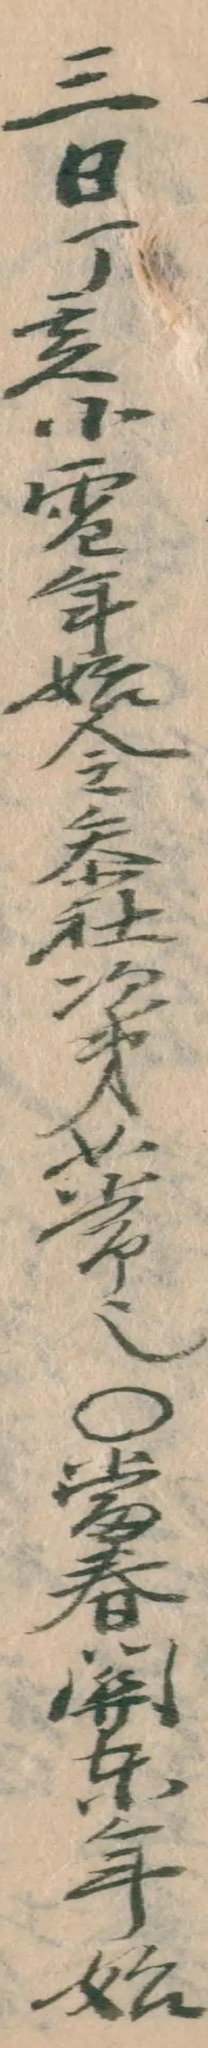三日丁亥小雹年始令参社次第如常也〇當春関東年始
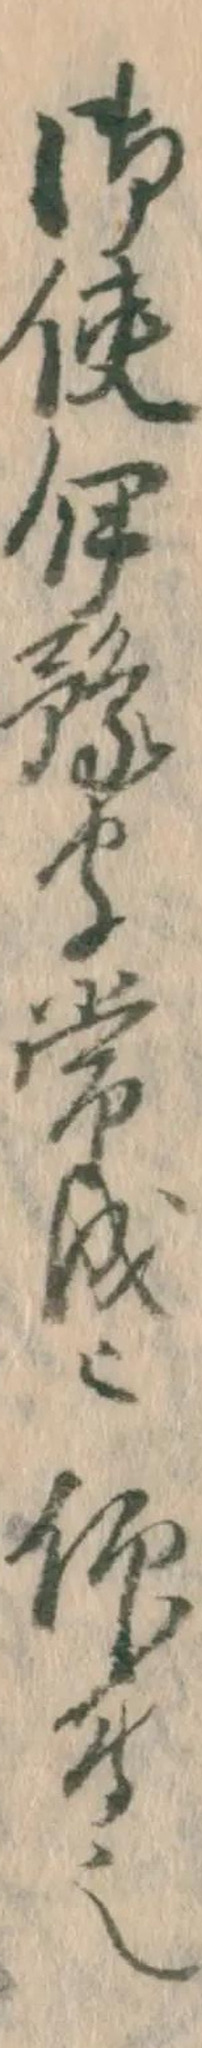御使伊豫守常成被仰付也
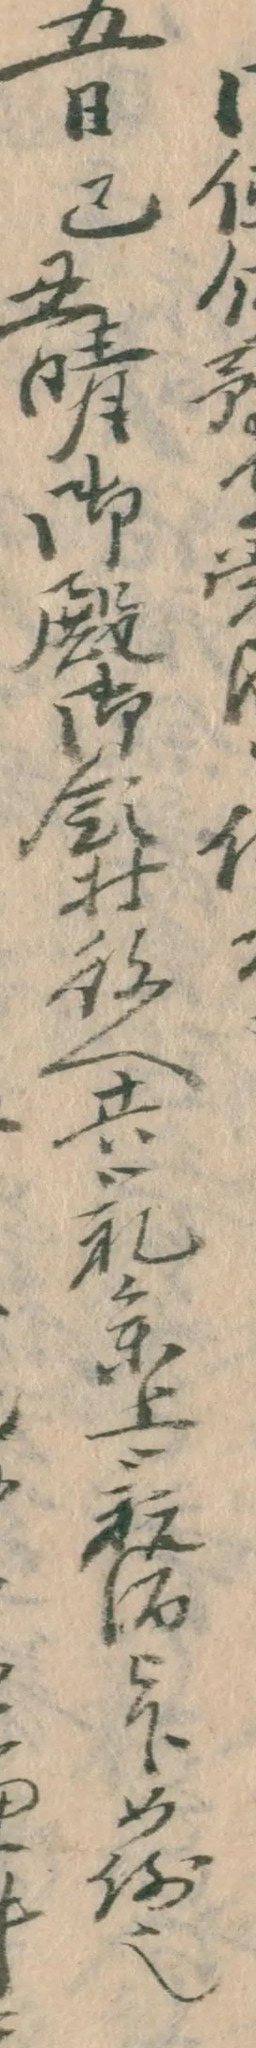五日己丑晴御殿御領村役人共御礼参上御祝酒被下如例也
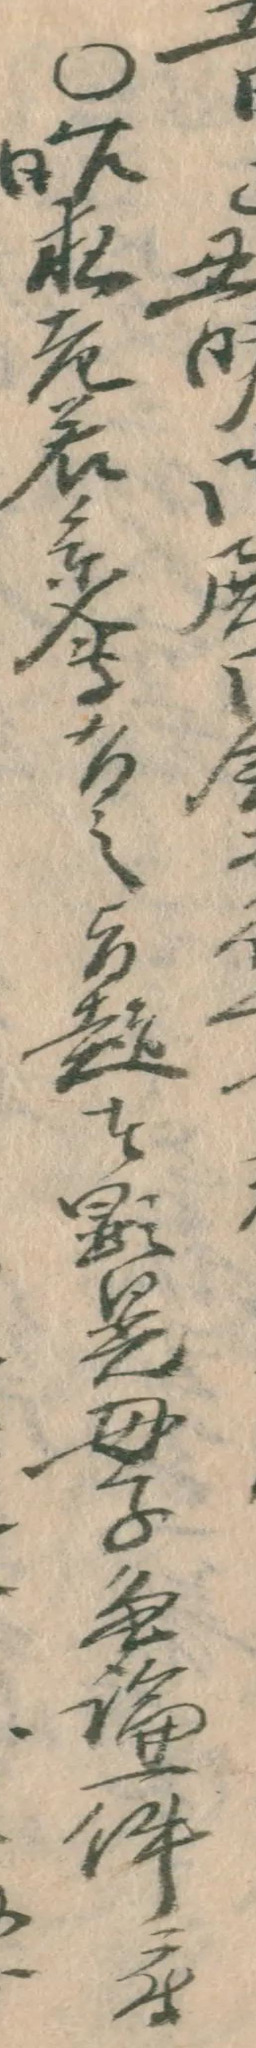○昨夜老若参會有之旨趣者顕晃母子争論一件ニ付
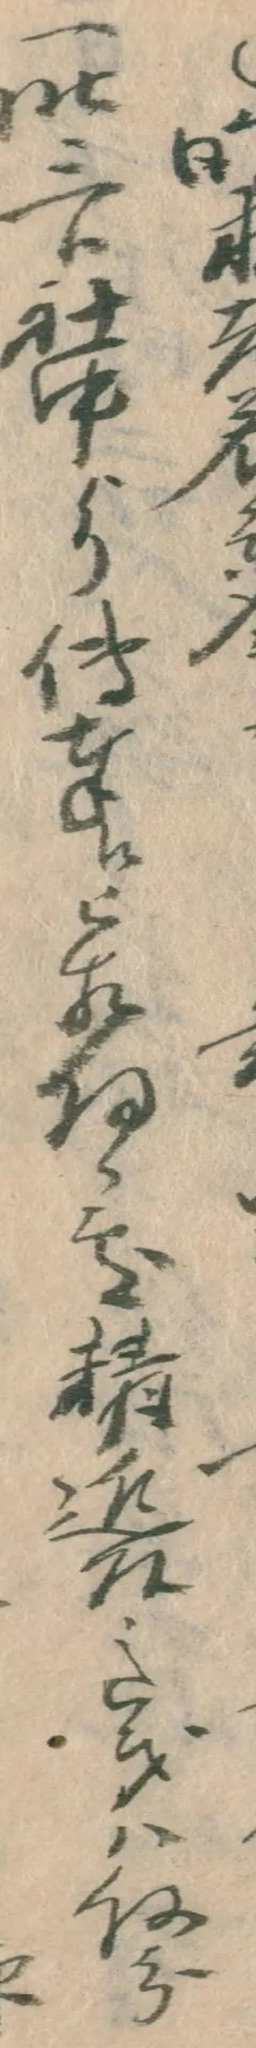一昨三日社中より傳奉え被相伺候處精進頭之義ハ何分
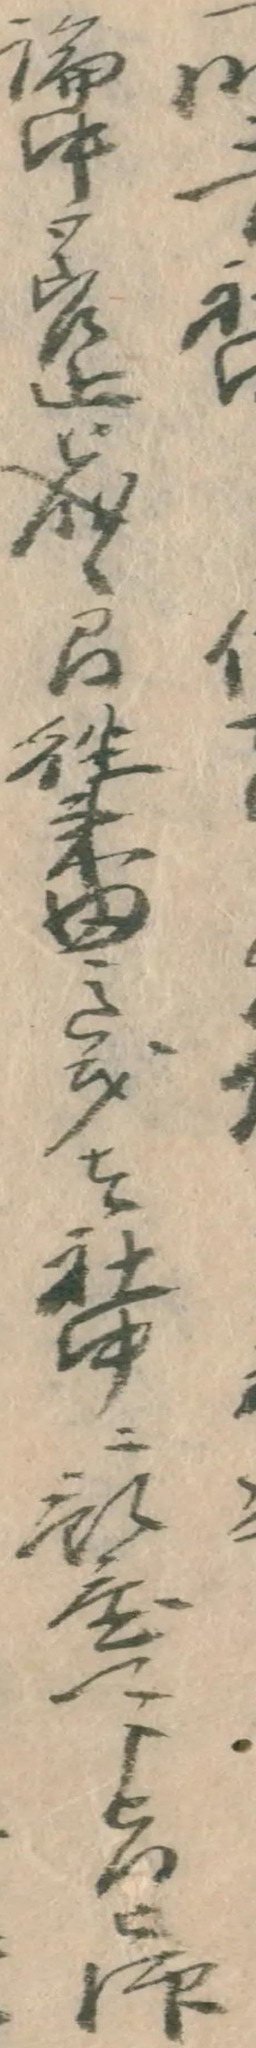論中御差止被成候間往来田之義は社中ニ預置可申旨被仰

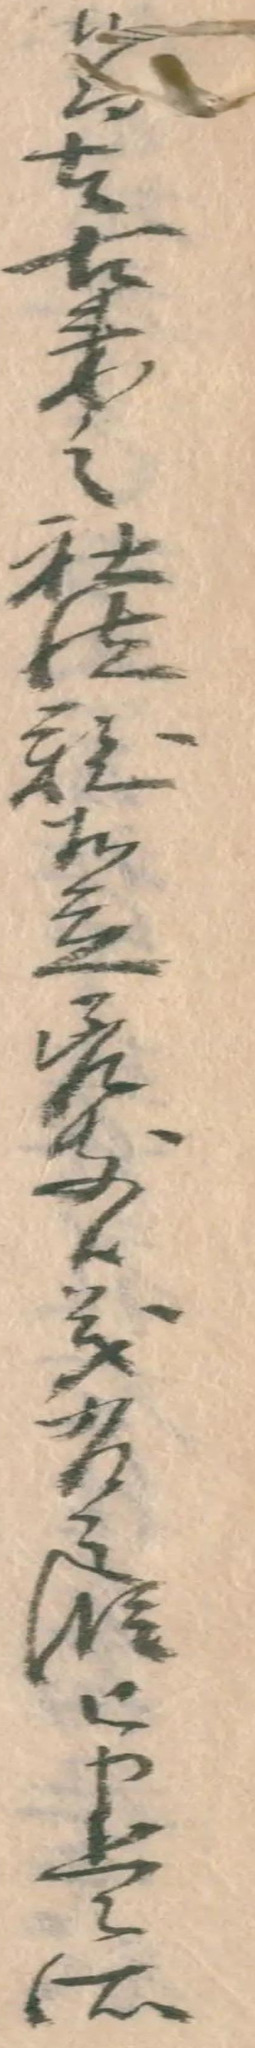候而は古来之社法難相立差支候義有之段被申上候所
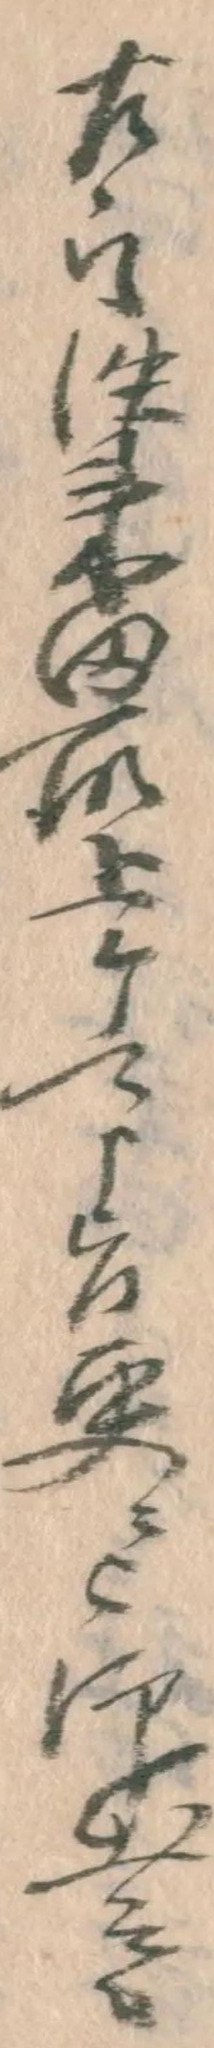左候ハヽ往来田取上ヶ可申旨更ニ被仰出候云々
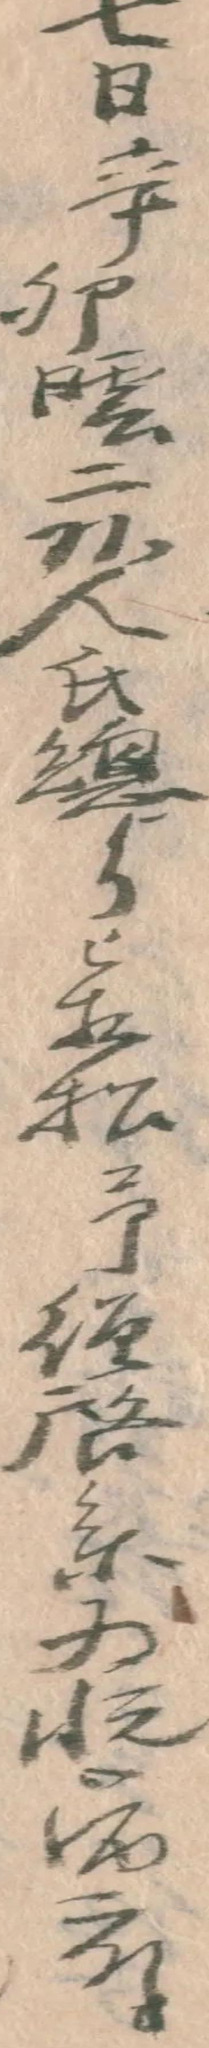七日辛卯曇二頭人氏總より被相招予経啓参為祝御酒二升
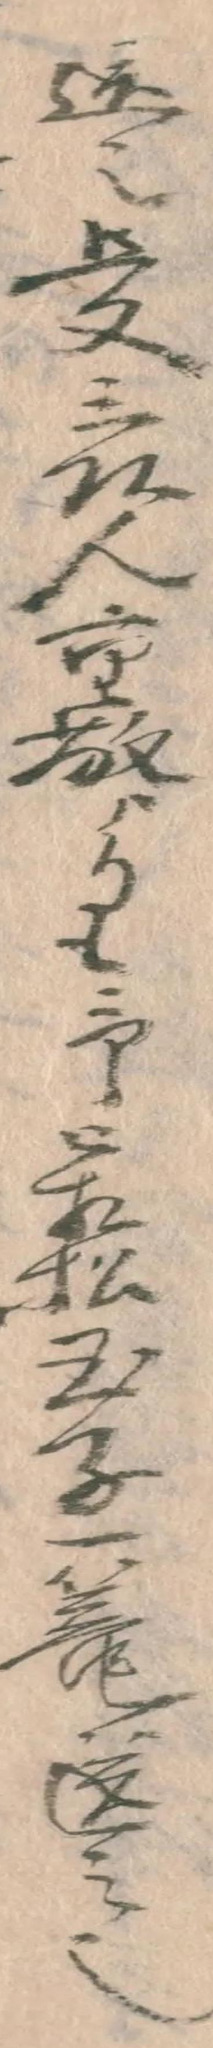送之且又三頭人重散よりも予被相招玉子一籠送之也
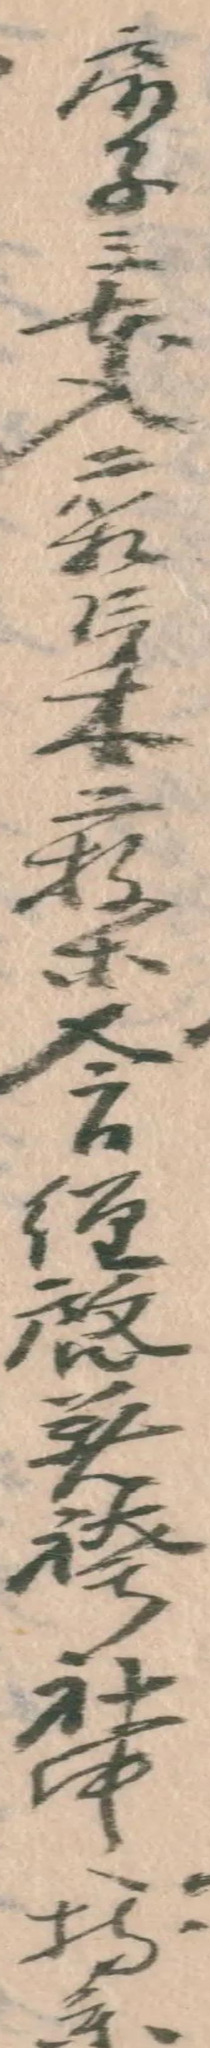扇子三本入二箱片木二枚等今経啓着袴社中へ持参
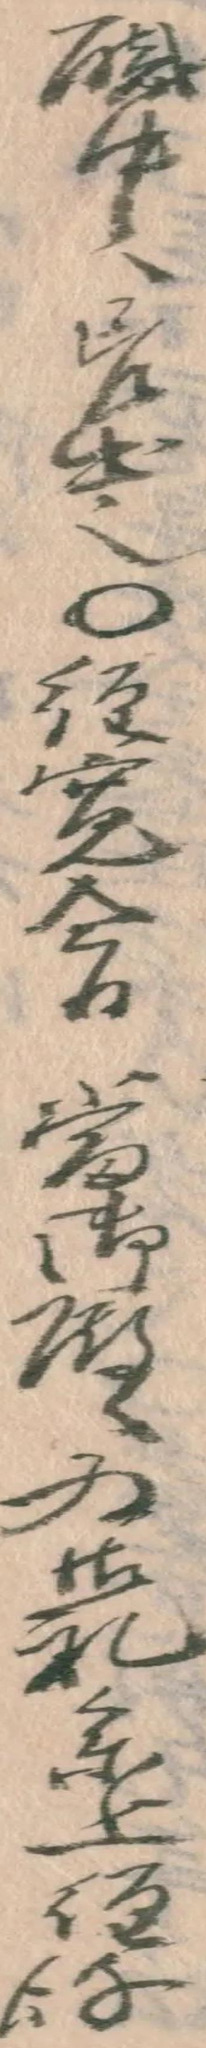職中へ差出也○経寛今日當御殿へ為御礼参上経千ゟ
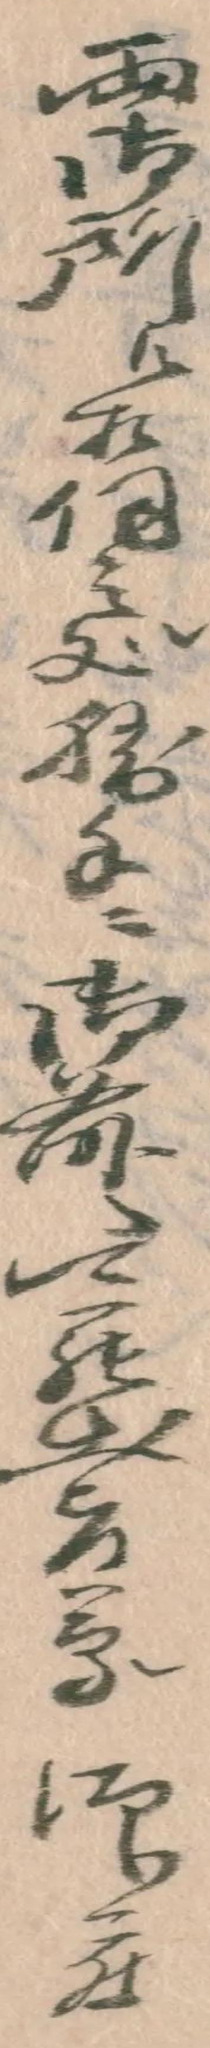両御所江相伺之処勝手ニ御前へ可罷出旨蒙仰下ニ付
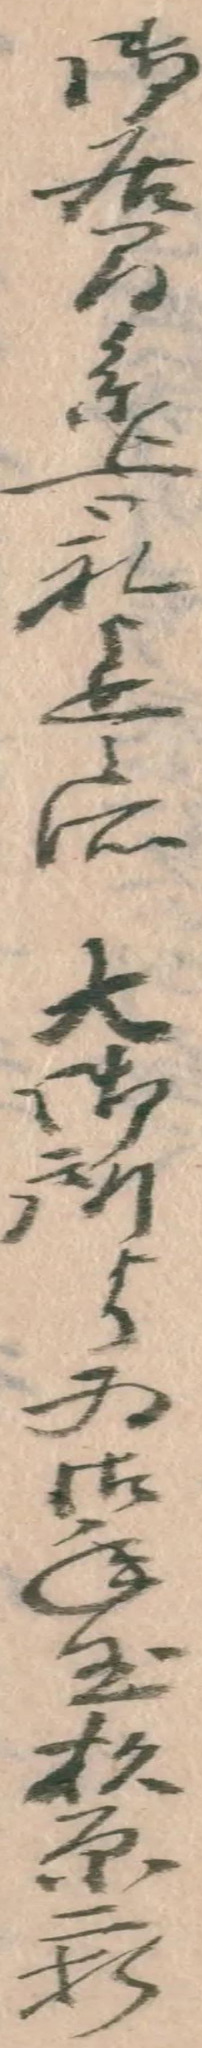御居間参上御礼申上候所大御所より為御年玉杦原二折
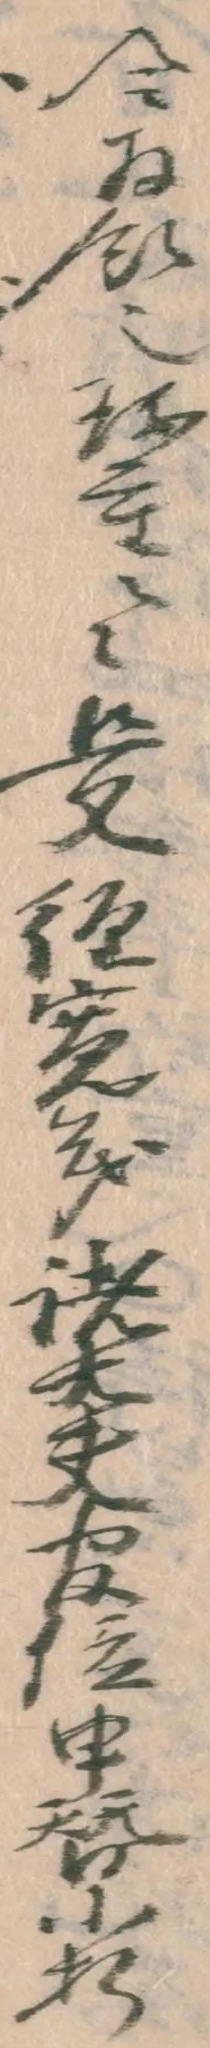令拝領之珍重々々且又経寛義諸大夫官位申替小折
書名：賀茂社記録. 第67冊
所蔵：国立国会図書館 National Diet Library, JAPAN
